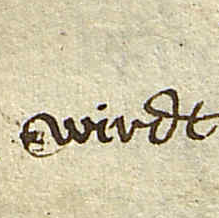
wirdt
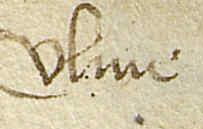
Vlme
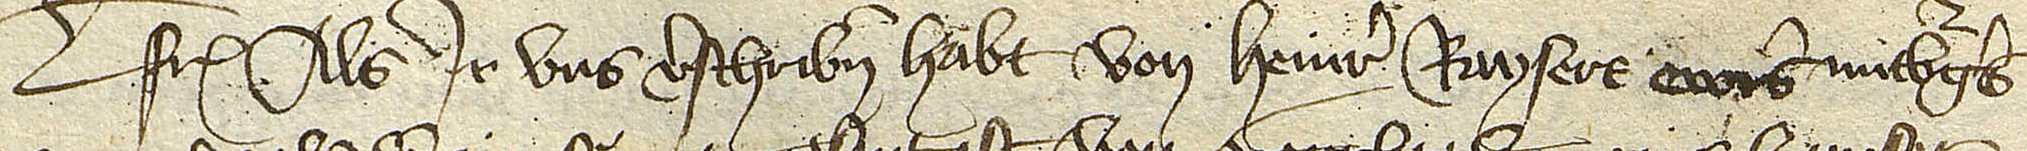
L* fr* Als Ir vns v*ſchribn* habt / von heinr* Rayſers ewrs* mitb*g*s
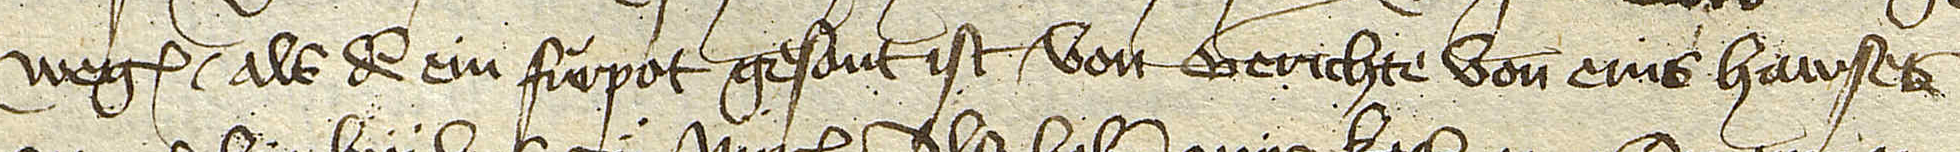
weg* / als d* ein fürpot geſant iſt / von Gerichte von eins hawſes
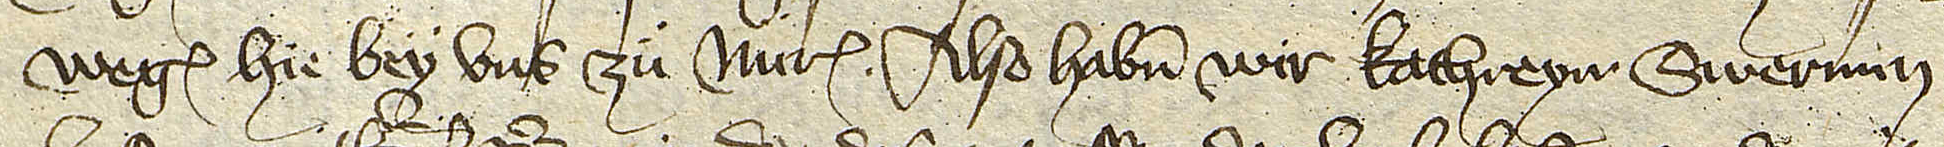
weg* hie bey vns cʒü Nür*. Alſo habn* wir kathreyn Swermin
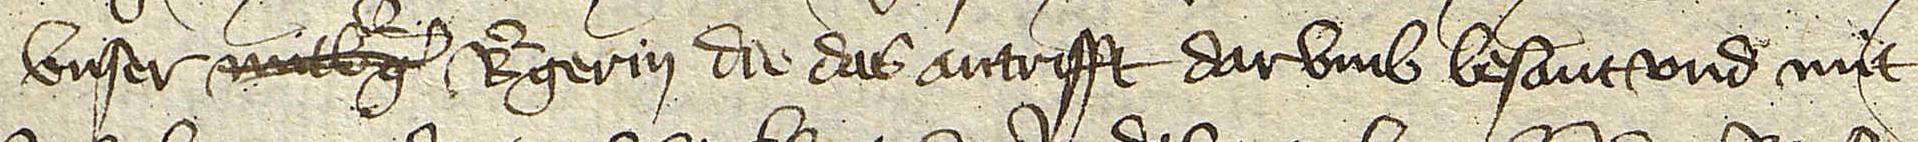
vnſer mitb*g* B*gerin die das antrifft darvmb beſant vnd mit
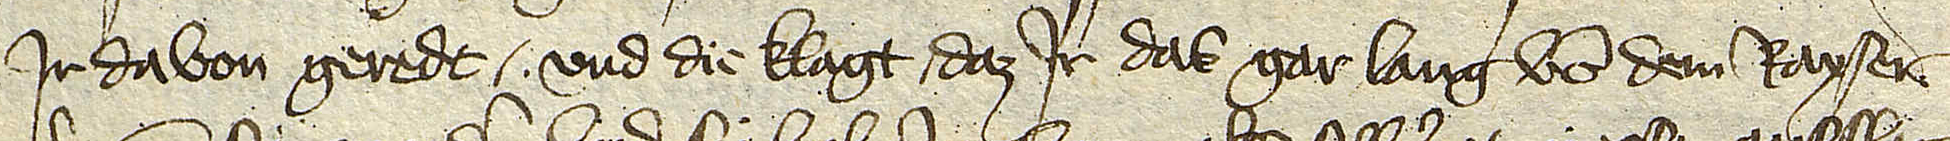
Ir davon geredt / . vnd die klagt / daʒ Ir das gar lang vo* dem Rayſer
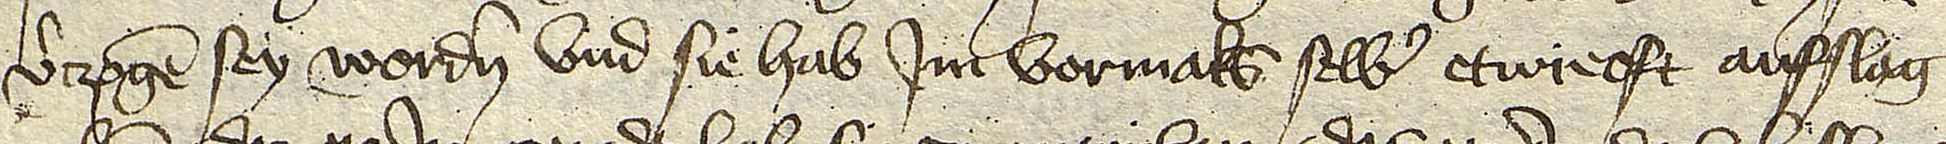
v*cʒoge* ſey wordn* vnd ſie hab Im vormals ſelb* etwieoft aufſlag
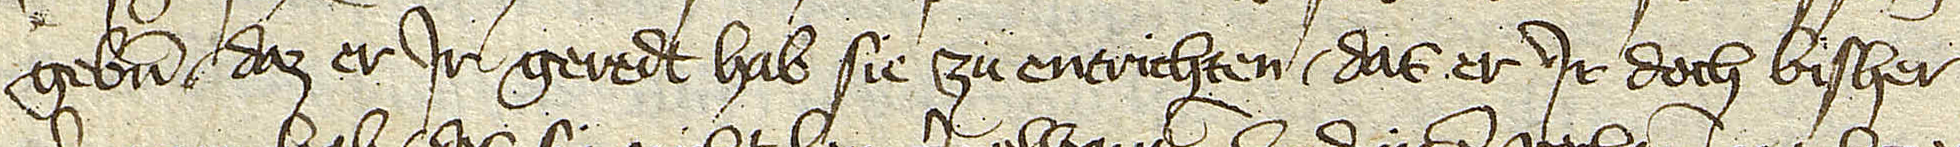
gebn* / daʒ er Ir geredt hab ſie cʒu entrichten / das er Ir doch biſher
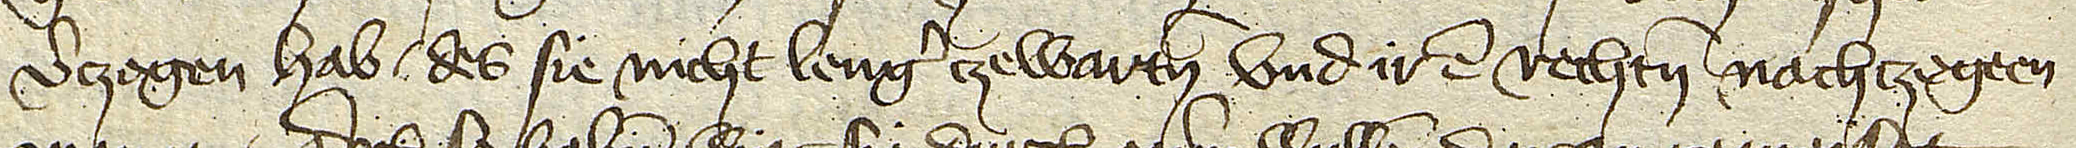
v*cʒogen hab / des ſie nicht leng* cʒewartn* vnd ire* rechtn* nachcʒegeen
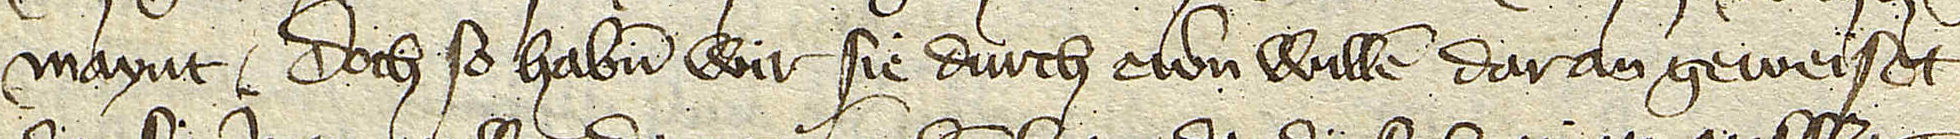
maynt / Doch ſo habn* wir ſie durch ew*n wille* daran geweiſet
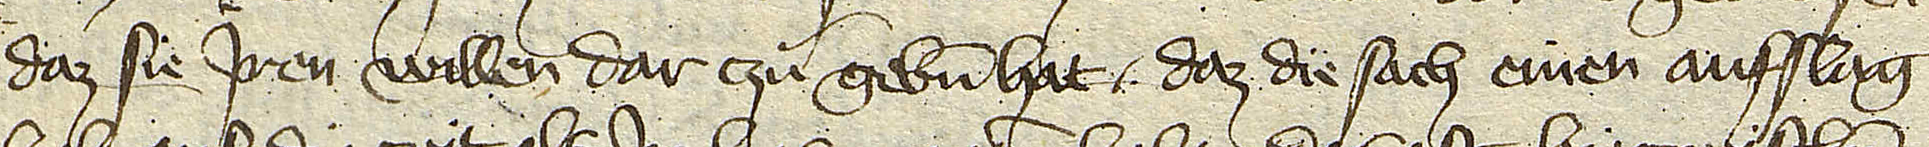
daʒ ſie Iren willen dar cʒü gebn* hat / daʒ die ſach einen aufſlag
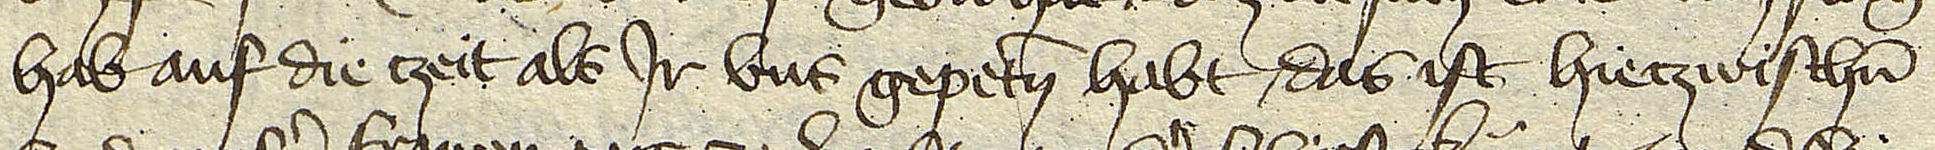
hab auf die cʒeit als Ir vns gepetn* habt / das iſt hiecʒwiſchn*
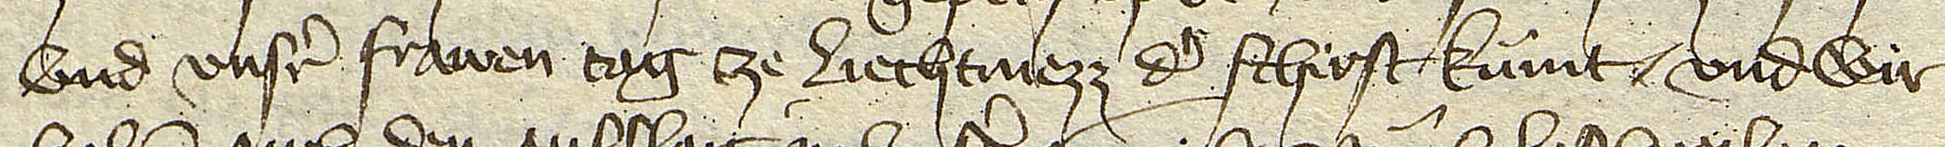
vnd vnſr* frawen tag cʒe Liechtmeʒʒ d* ſchirſt kümt / vnd wir
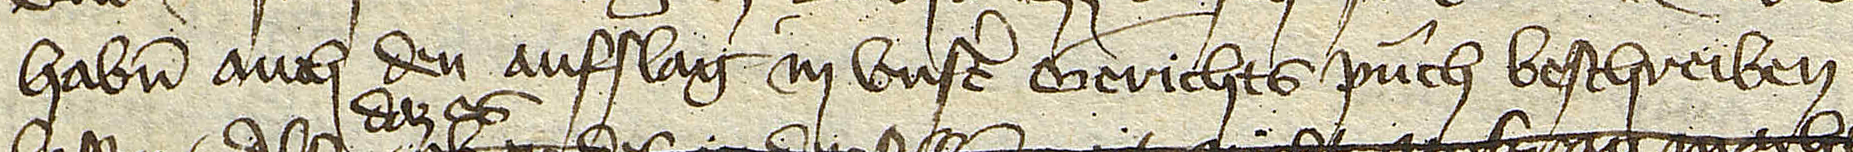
habn* auch den aufſlag in vnſs* Gerichts püch beſchreiben
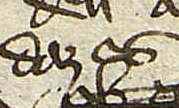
daʒ es
